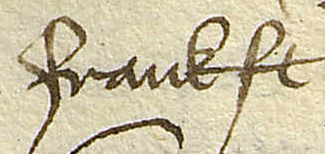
Frankft*
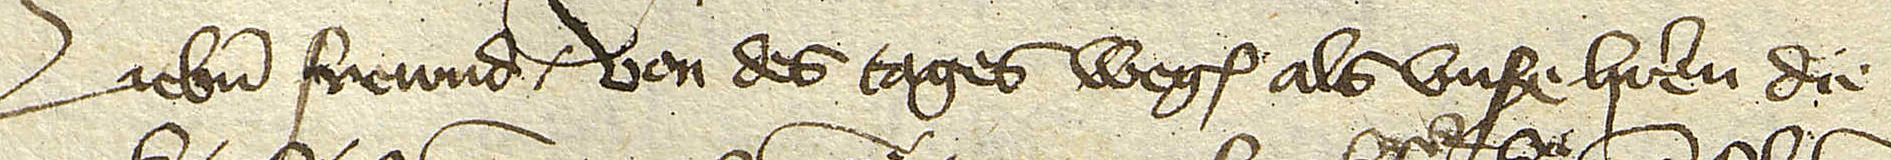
Liebn* frewnd / Von des tages weg* als vnſ*r hr*en die
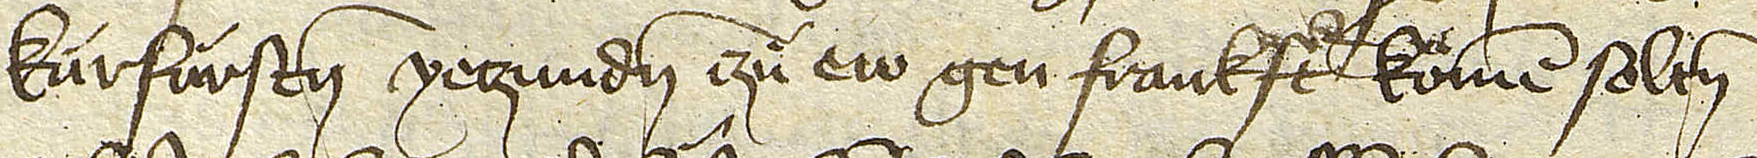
kürfürſtn* yecʒundn* cʒü ew gen frankft* köme* ſoltn*
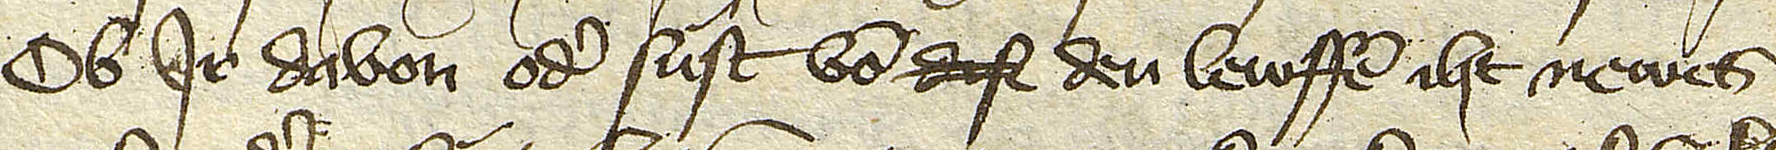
Ob Ir davon od* ſüſt vo* diſe den lewffe* iht newes
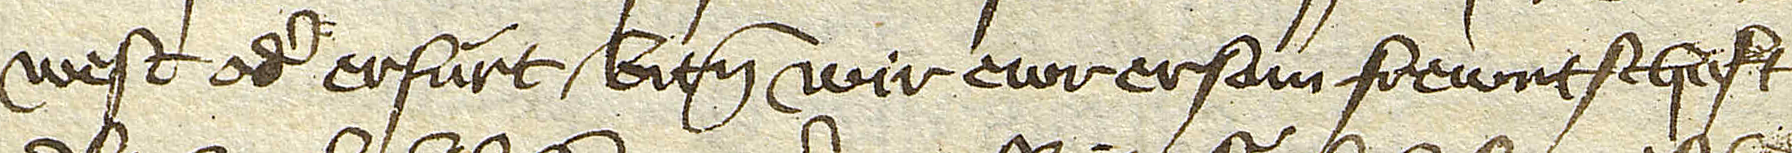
weſt od* erfürt / bitn* wir ewr erſam frewntſchaft
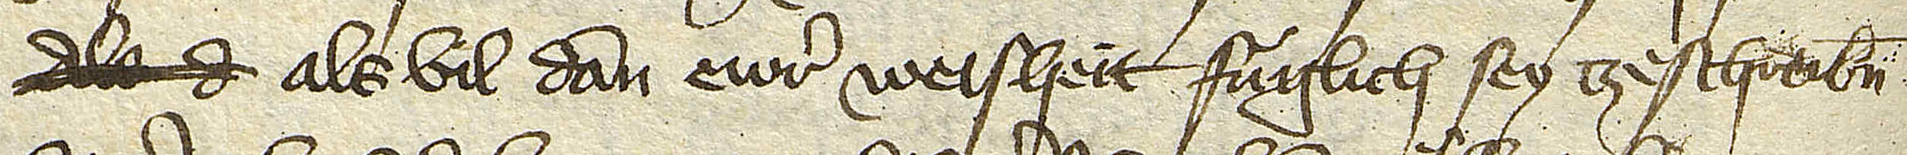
Als d als vil dan* ewr* weiſheit füglich ſey cʒeſchreibn*
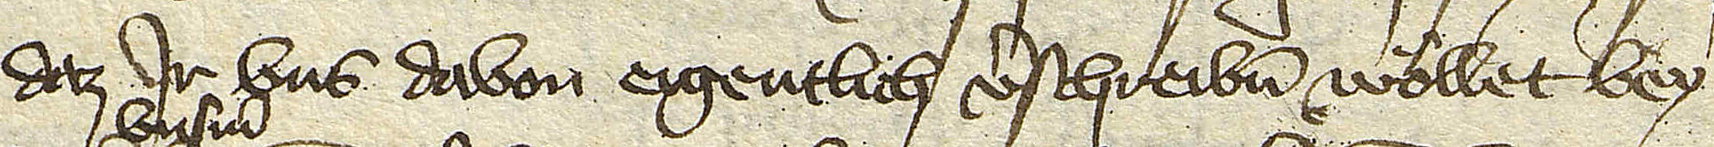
daʒ Ir vns davon eigentlich v*ſchreibn* wöllet bey
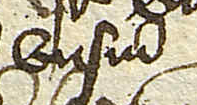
vnſm*
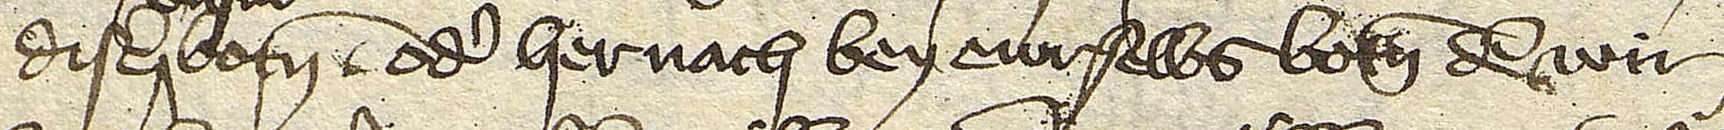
diſe* botn* / od* hernach bey ewrſelbs botn* d* wir
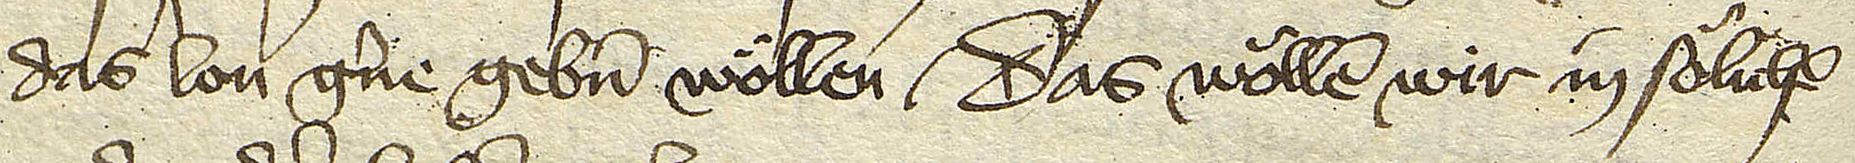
das von g*ne gebn* wöllen / Das wölle* wir in ſöliche*
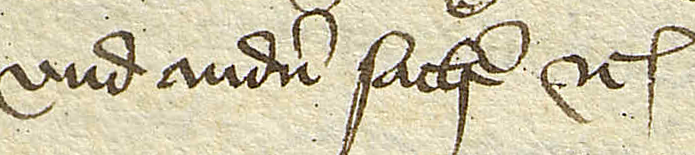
vnd andn* ſache* ec*
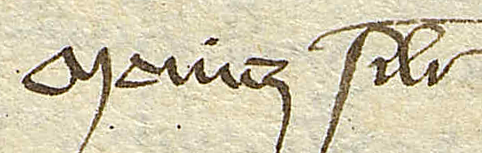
Meincʒ ſilr*
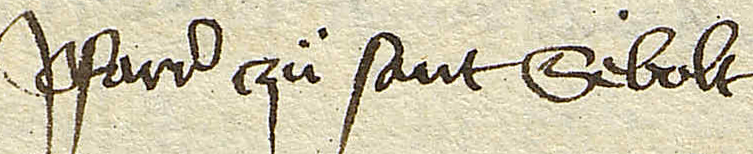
Pfarr* cʒü ſant Sebolt
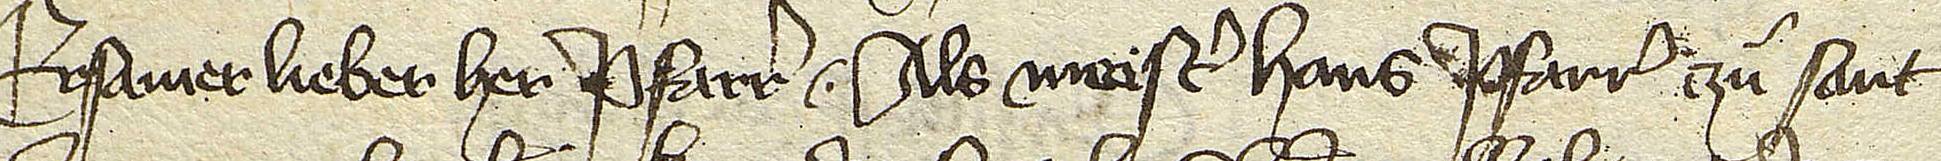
Erſamer lieber her Pfarr* / . Als meiſt* hans Pfarr* cʒü ſant
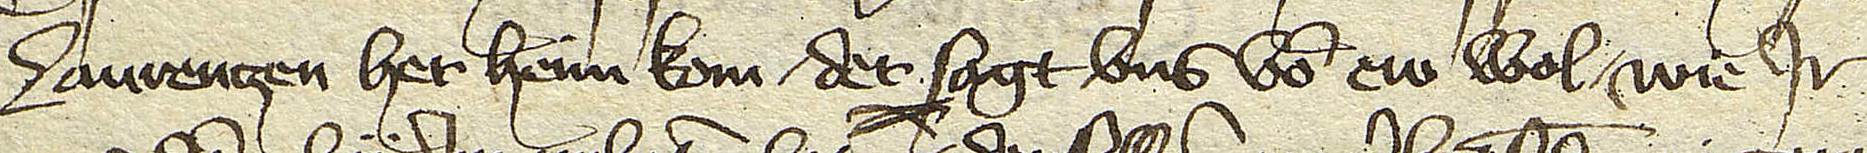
Laurencʒen her heim kom / der ſagt vns vo* ew wol / wie Ir
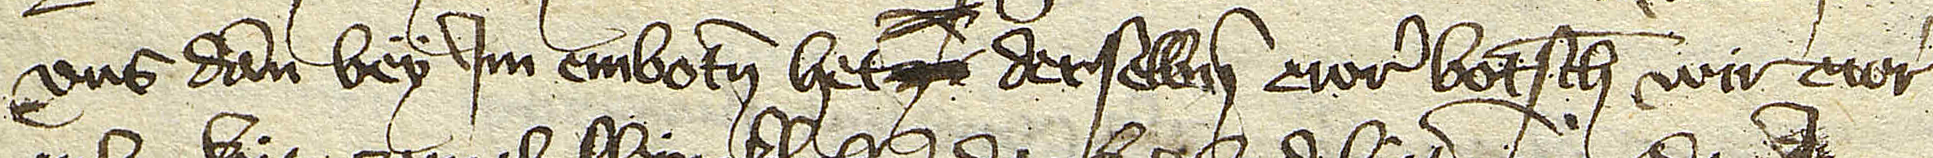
vns dan* bey Im embotn* hetn / derſelbn* ewr* botſch* wir ewr*
